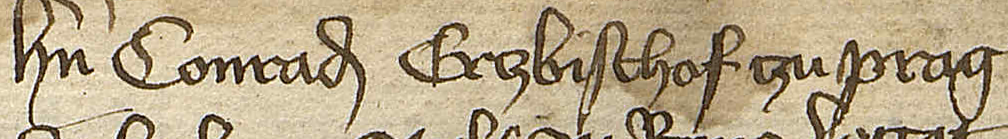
hn* Conrad* Ercʒbiſchof cʒu Prag
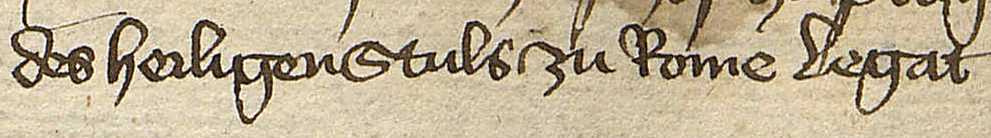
des heiligen Stuls cʒu Rome Legat
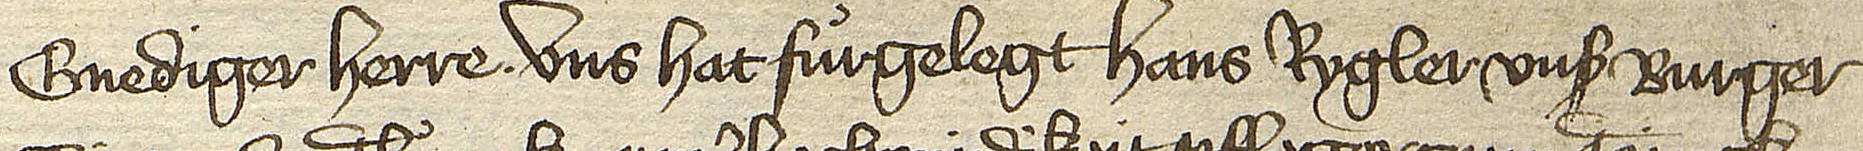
Gnediger herre . Vns hat fürgelegt hans Rygler vnſ* Burger
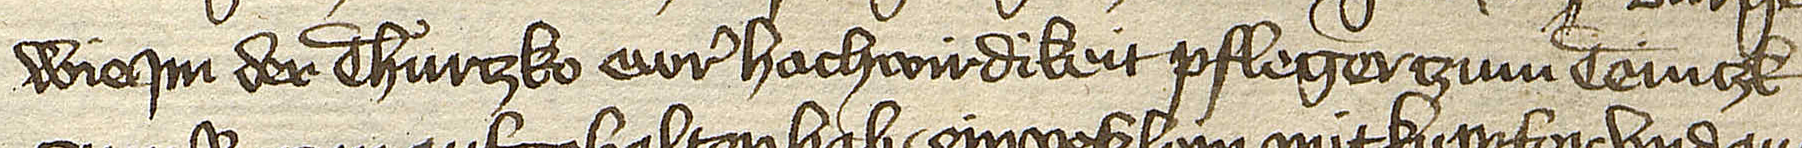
wie Im der Thürcʒko ewr* hochwirdikeit pfleger cʒum Teincʒk
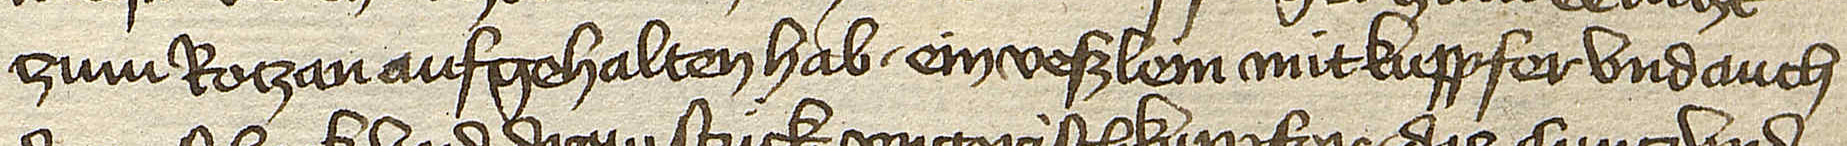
cʒum Rocʒan aufgehalten hab / ein veſʒlein mit kuppfer vnd auch
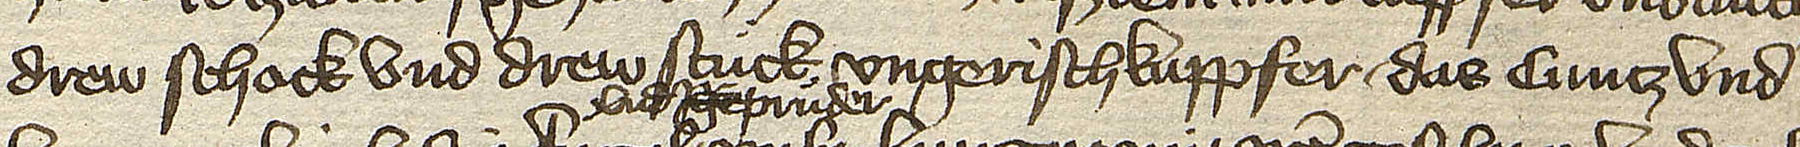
drew ſchock vnd drew ſtück vngeriſch kuppfer / das Cuncʒ vnd
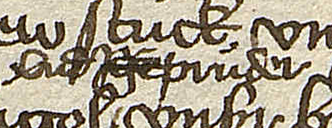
vnd Ir geprüder
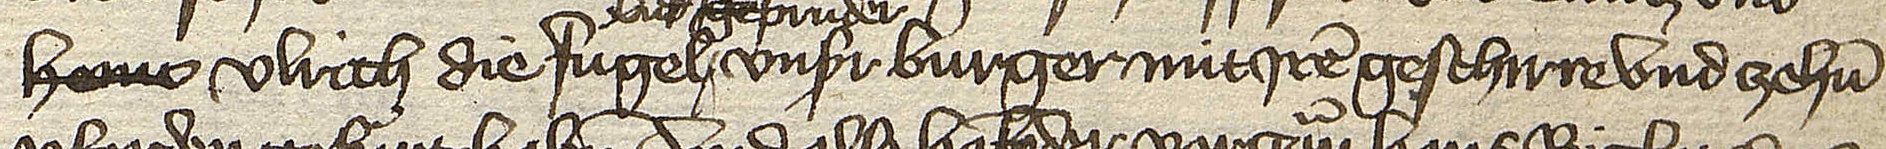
heincʒ vlrich die Fügel vnſ*r burger mit Ire* geſchirre vnd cʒehn*
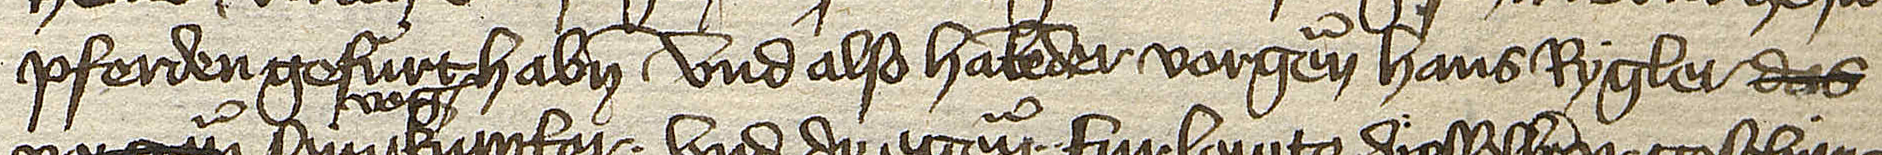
pferden gefürt habn* / vnd alſo habe* der vorgen* hans Rygler das
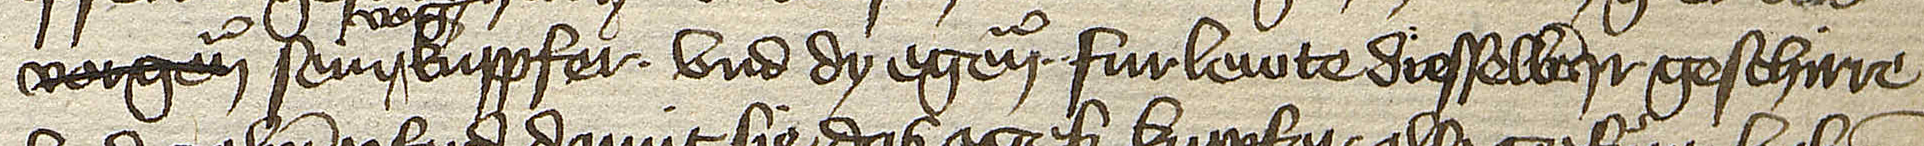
vorgen* ſein kupffer . vnd dy egen* ~ furlewte dieſſelbn* Ir geſchirre
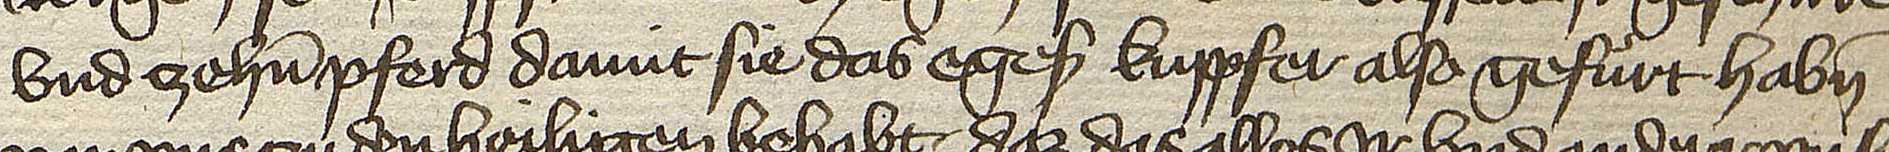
vnd cʒehn* pferd damit ſie das egeſ* kuppfer alſo gefürt habn*
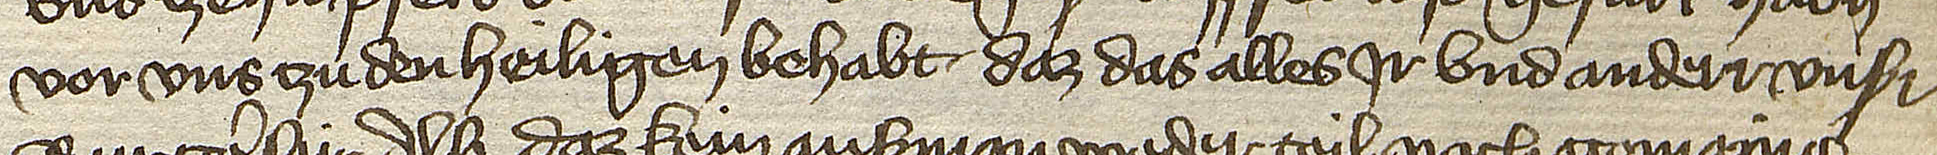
vor vns cʒu den heiligen behabt / daʒ das alles Ir vnd anderr vnſ*r
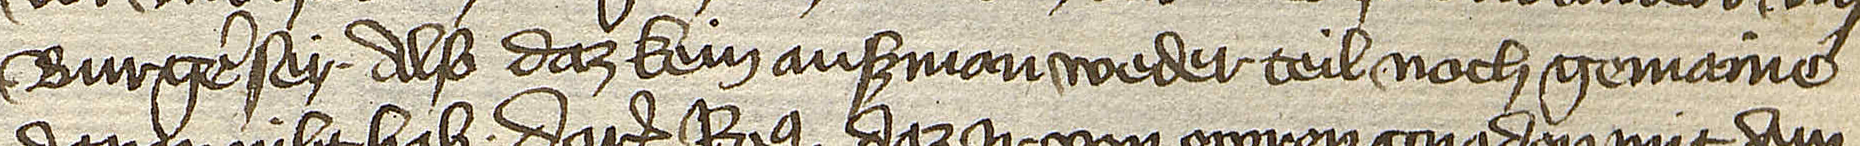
Burge* ſey . Alſo daʒ kein auſʒman weder teil noch gemaine
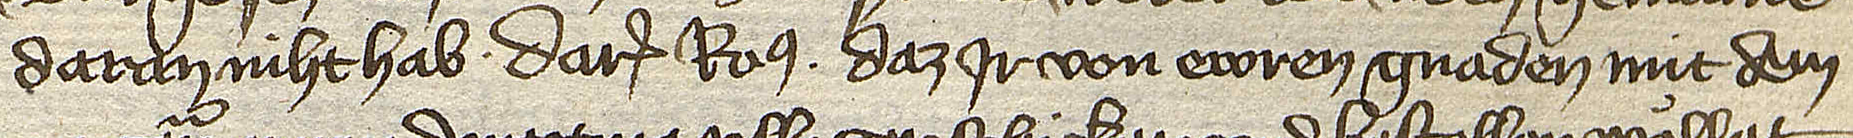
daran niht hab . Dar* Ro* . daʒ von ewren gnaden mit dem
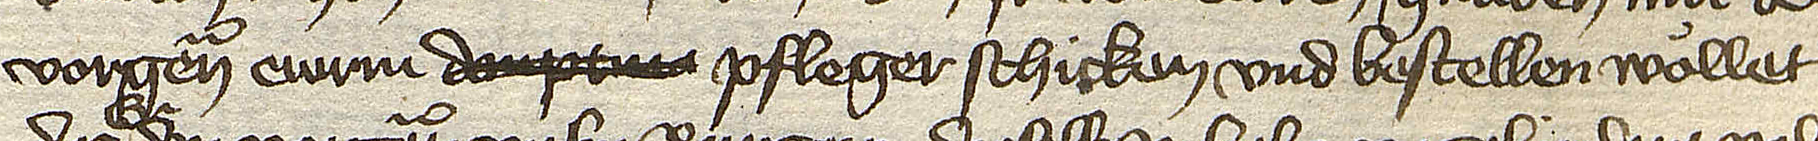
vorgen* ewrm* Amptma pfleger ſchicken vnd beſtellen wöllet
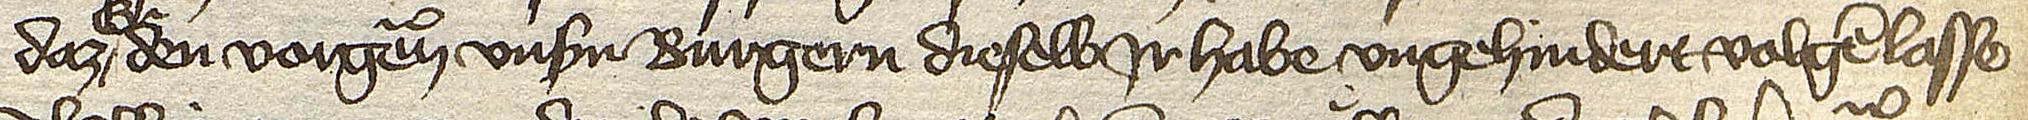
daʒ den vorgen* vnſ*n Burgern dieſelb Ir habe vngehindert volge* laſſe
